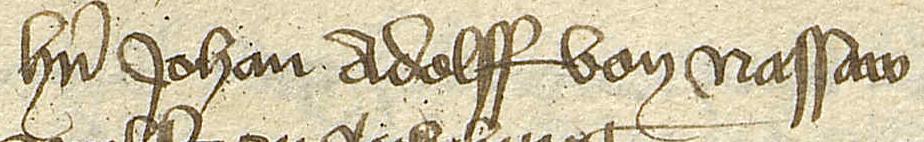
hn* Iohan Adolff von Naſſaw
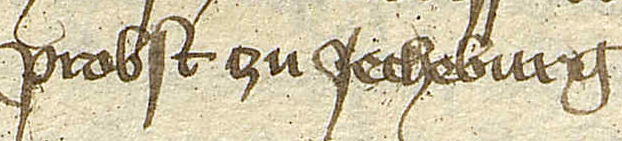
Probſt cʒu Iecheburg
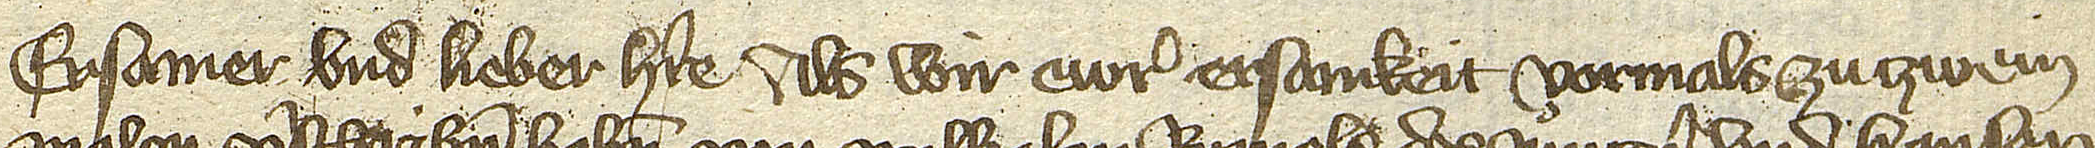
Erſamer vnd lieber hr*e Als wir ewr* erſamkeit vormals cʒu cʒwein
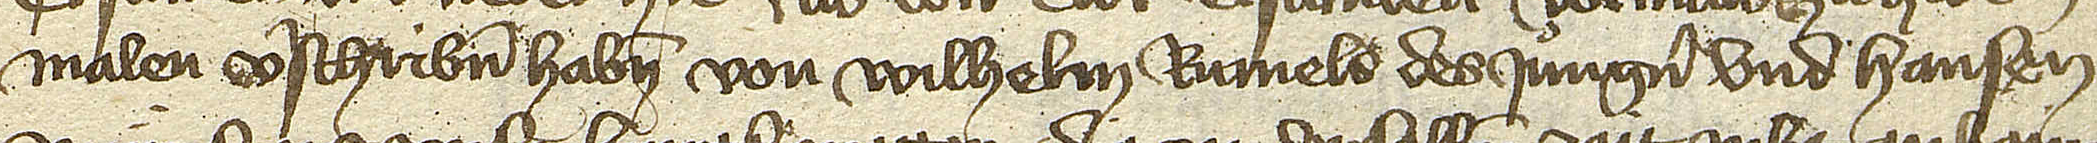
malen v*ſchribn* habn* von wilhelm Rumels des Iüngn* vnd hanſen
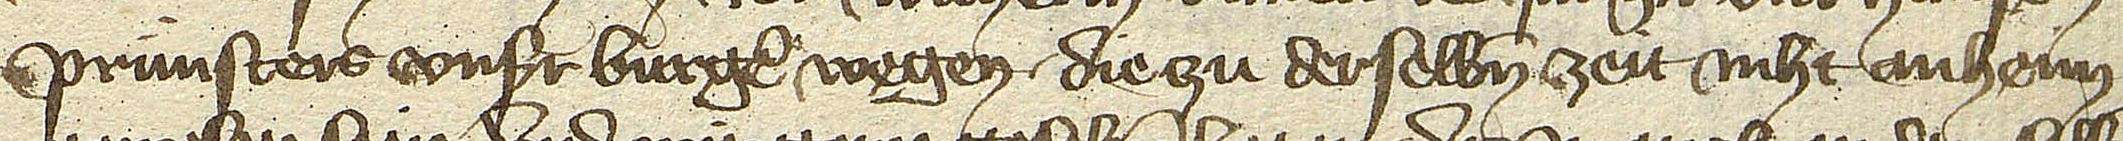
prünſters vnſ*r burge* wegen / die cʒu derſelbn* cʒeit niht anheim
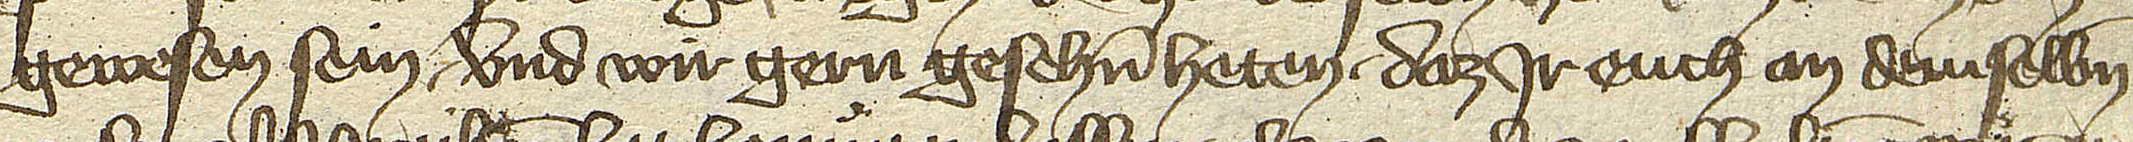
geweſen ſein / vnd wir gern geſehn* heten / daʒ Ir euch an demſelbn*
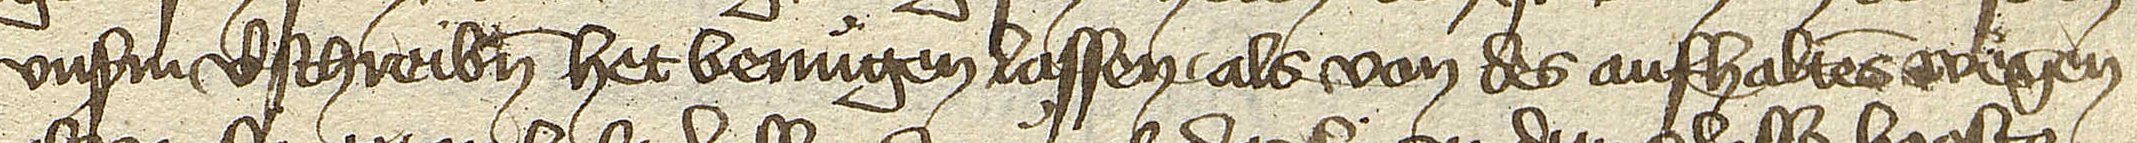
vnſ*m v*ſchreibn* het benügen laſſen / als von des aufhaltes* wegen
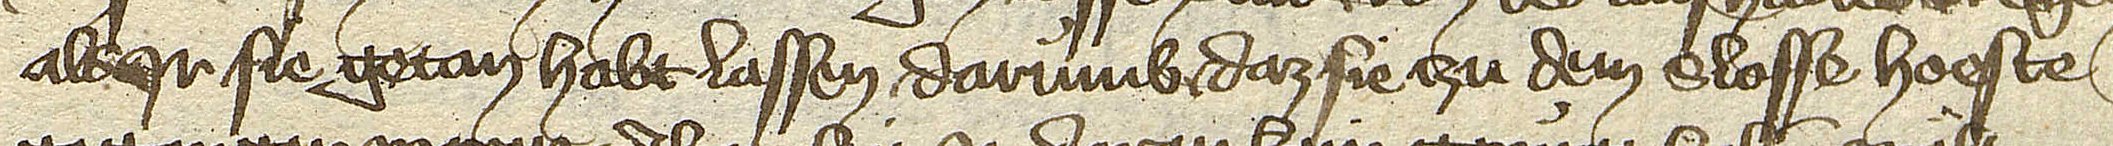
als Ir ſie getan habt laſſen / darümb / daʒ ſie cʒu dem Sloſſe hoeſte
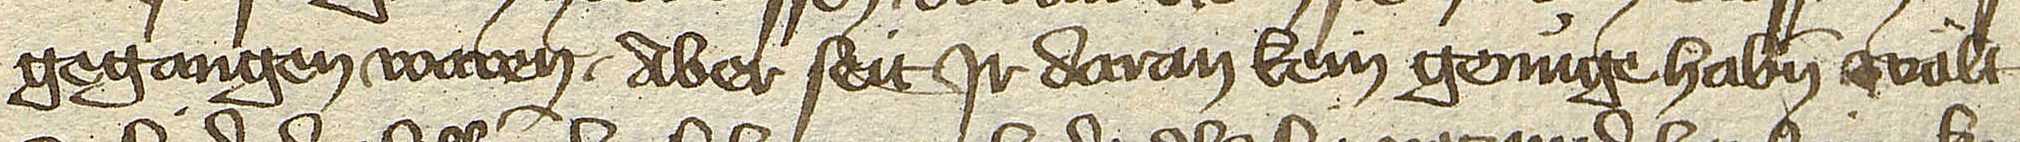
gegangen waren / Aber ſeit Ir daran kein genüge habn* wölt
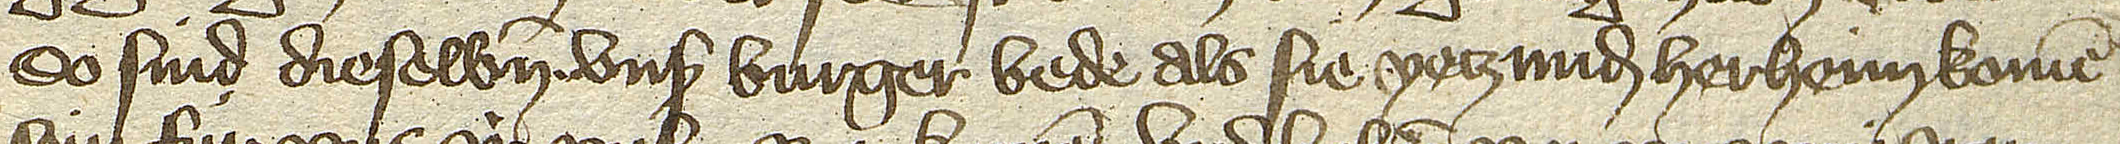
So ſind dieſelbn* ~ vnſ* burger bede Als ſie yecʒund* herheim kome*
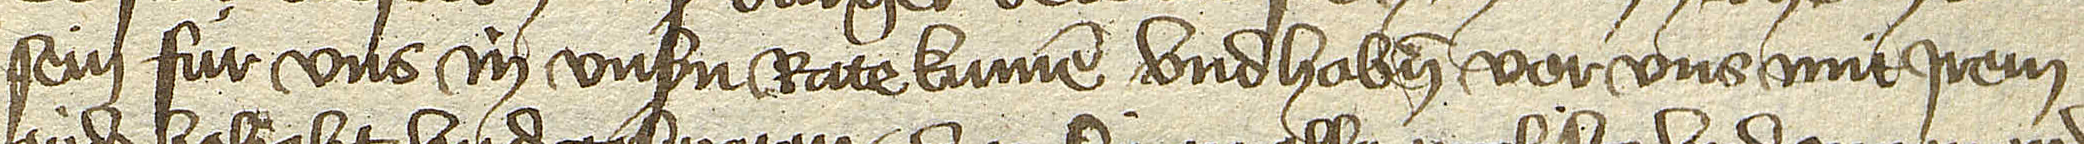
ſein für vns in vnſ*n Rate kume* / vnd habn* vor vns mit Irem
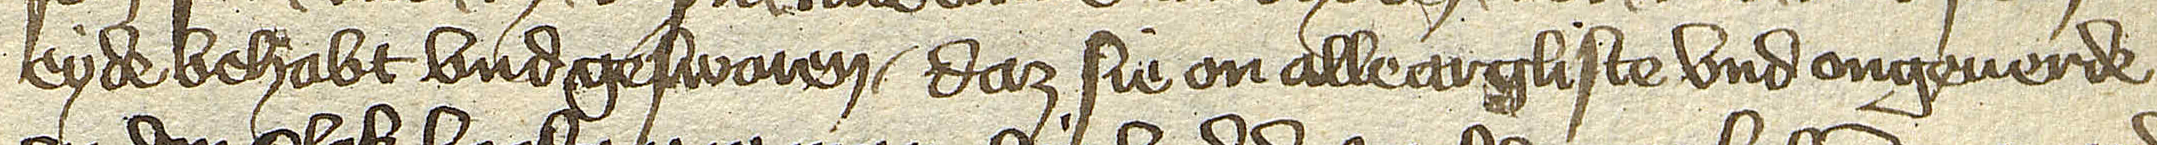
eyde behabt vnd geſworen / daʒ ſie on alle argliſte vnd ongeuerde
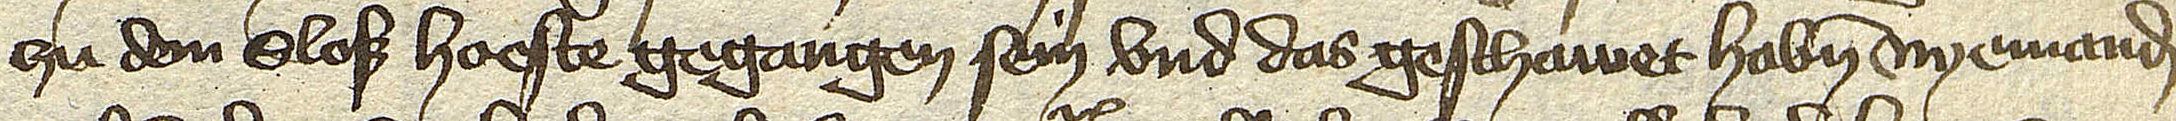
cʒu dem Sloſʒ hoeſte gegangen ſein vnd das geſchawet habn* nyemand*
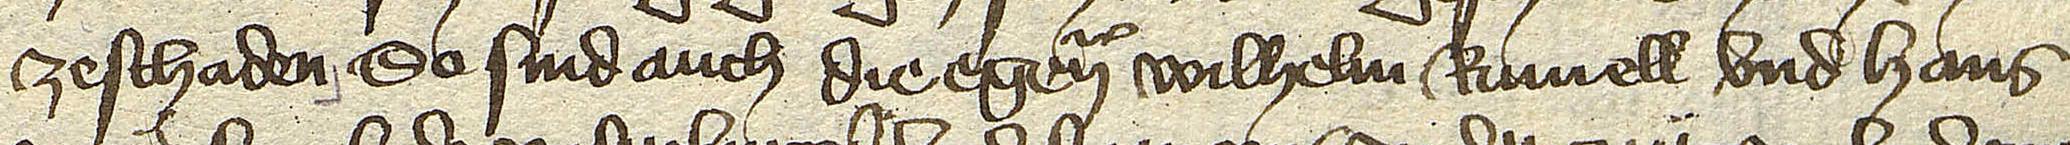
cʒeſchaden / So ſind auch die egen* wilhelm Rumell vnd hans
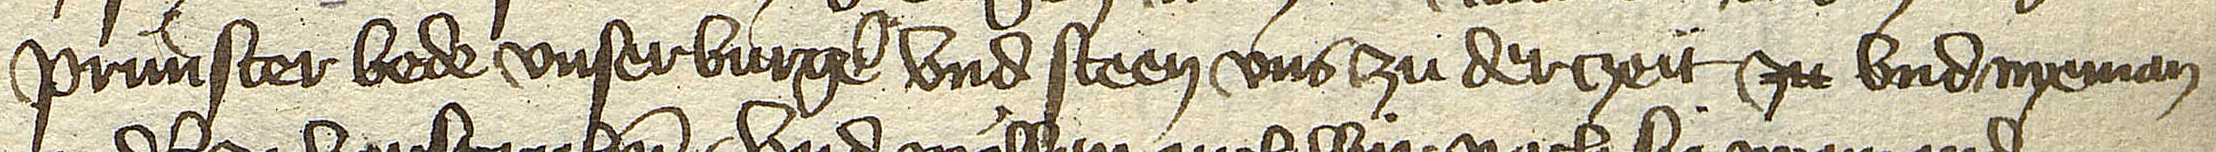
Prünſter bede vnſer burge* vnd ſteen vns cʒu der cʒeit cʒu vnd nyeman
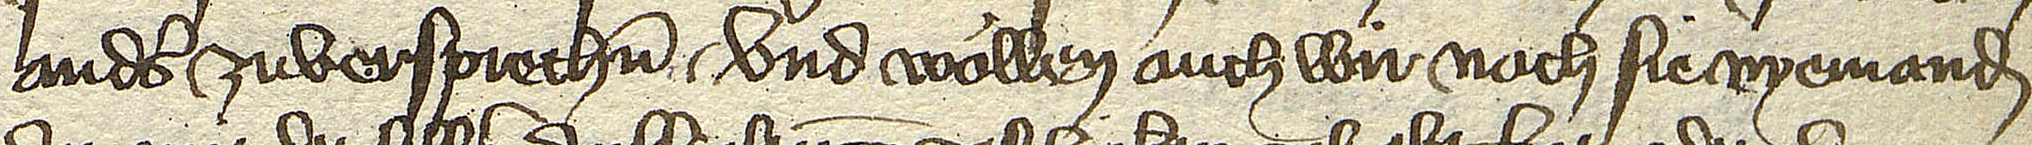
ands* cʒu verſprechn* / vnd wölen auch wir noch ſie nyemand*
